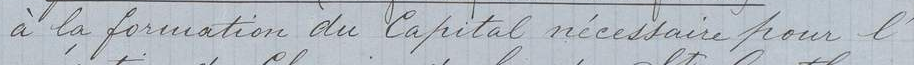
à la formation du Capital nécessaire pour l'
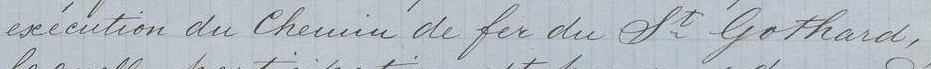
exécution du Chemin de fer du St Gothard,
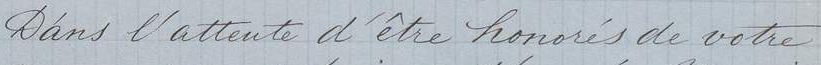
Dans l'attente d'être honorés de votre
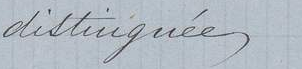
distinguée
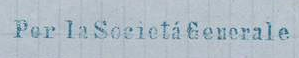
Per la Società Generale
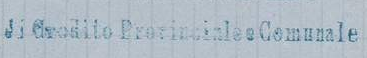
di Credito Provinciale e Comunale
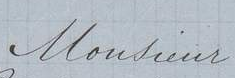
Monsieur
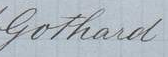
Gothard
